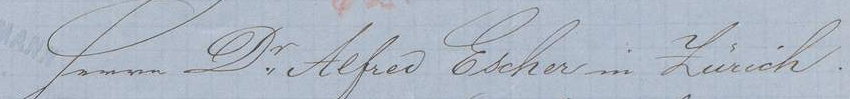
Herrn Dr Alfred Escher in Zürich
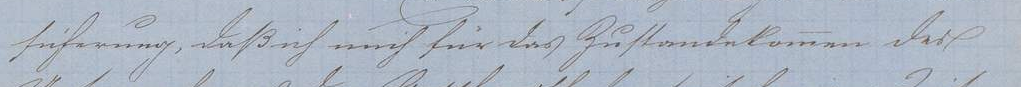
sicherung, daß ich mich für das Zustandekommen des
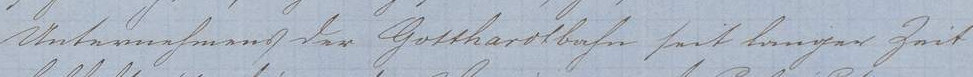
Unternehmens der Gotthardtbahn seit langer Zeit
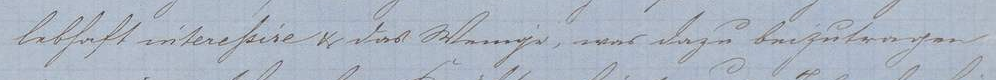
lebhaft interessire & das Wenige, was dazu beizutragen
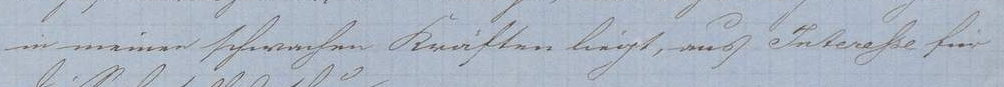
in meinen schwachen Kräften liegt, aus Interesse für
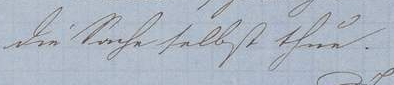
die Sache selbst thue.
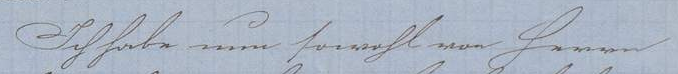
Ich habe nun sowohl von Herrn
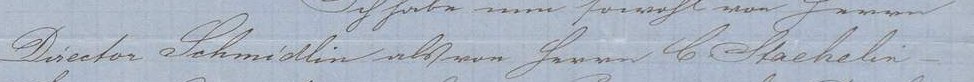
Director Schmidlin als von Herrn C. Staehelin-
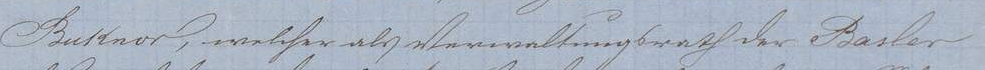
Buknor, welcher als Verwaltungsrath der Basler
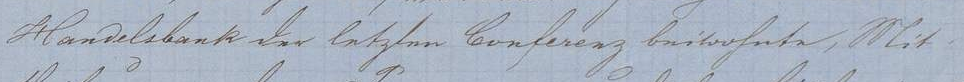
Handelsbank der letzten Conferenz beiwohnte, Mit-
